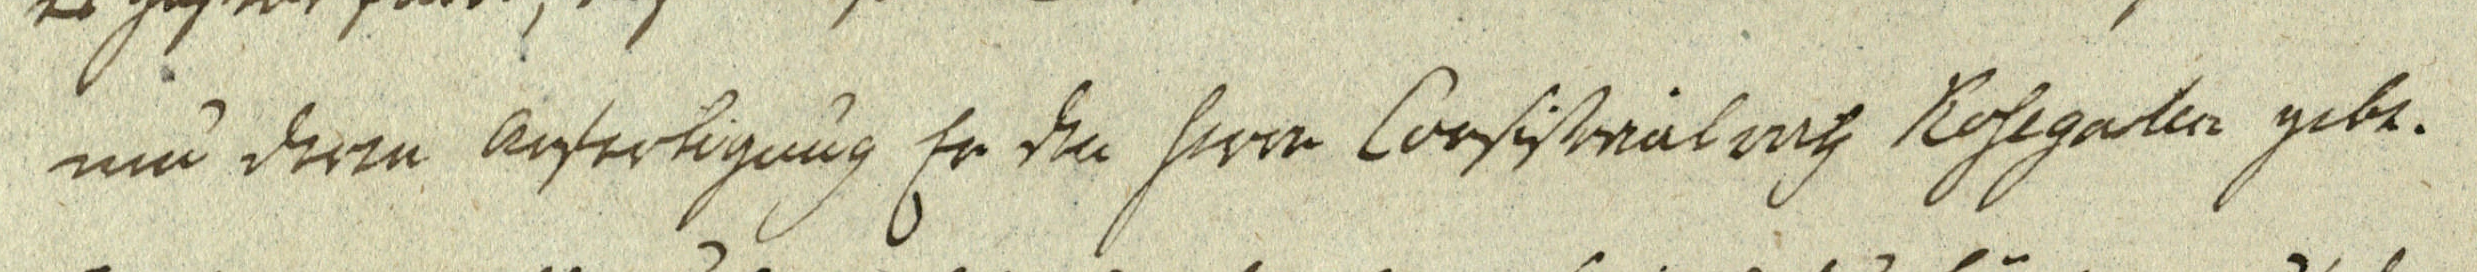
nun deren Anfertigung Er den Herr Consistorialrath Kosegarten gebe¬
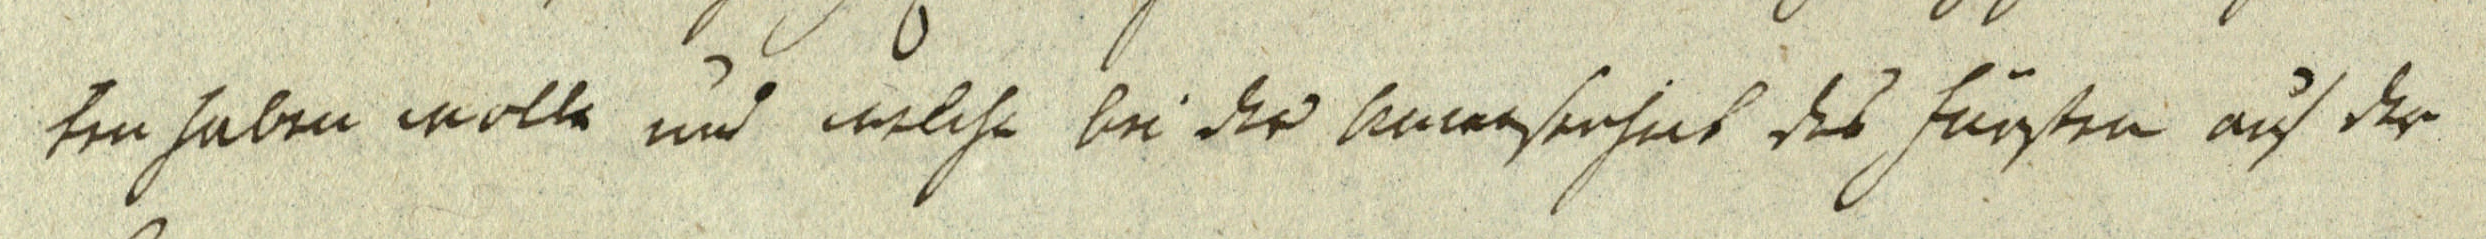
ten haben wolle und welche bei der Anwesenheit des Fürsten auf der
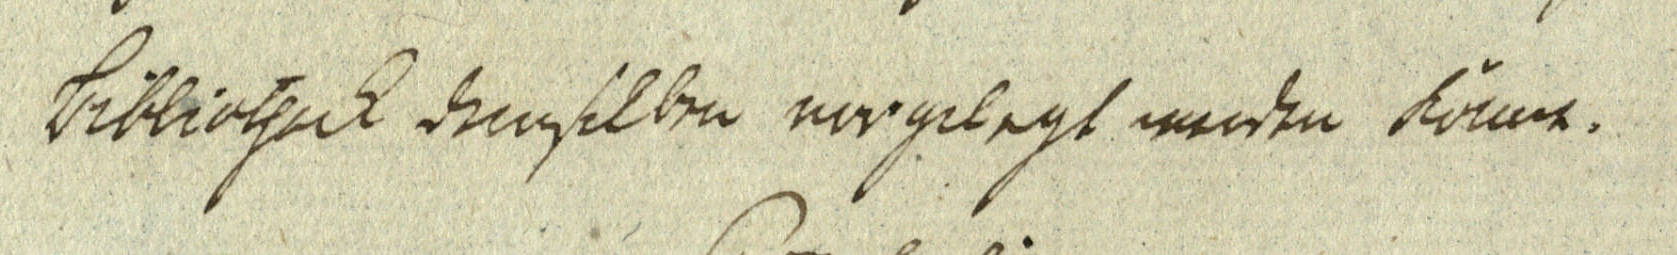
Bibliotheck demselben vorgelegt werden könne.
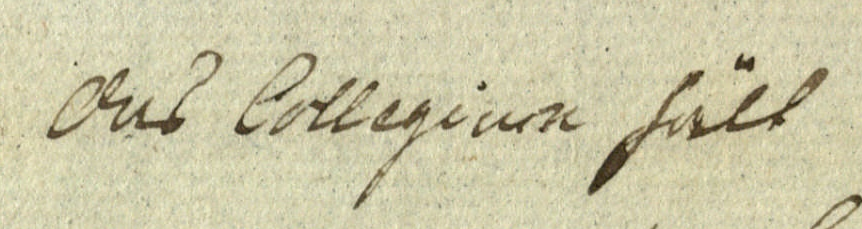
Das Collegium hält
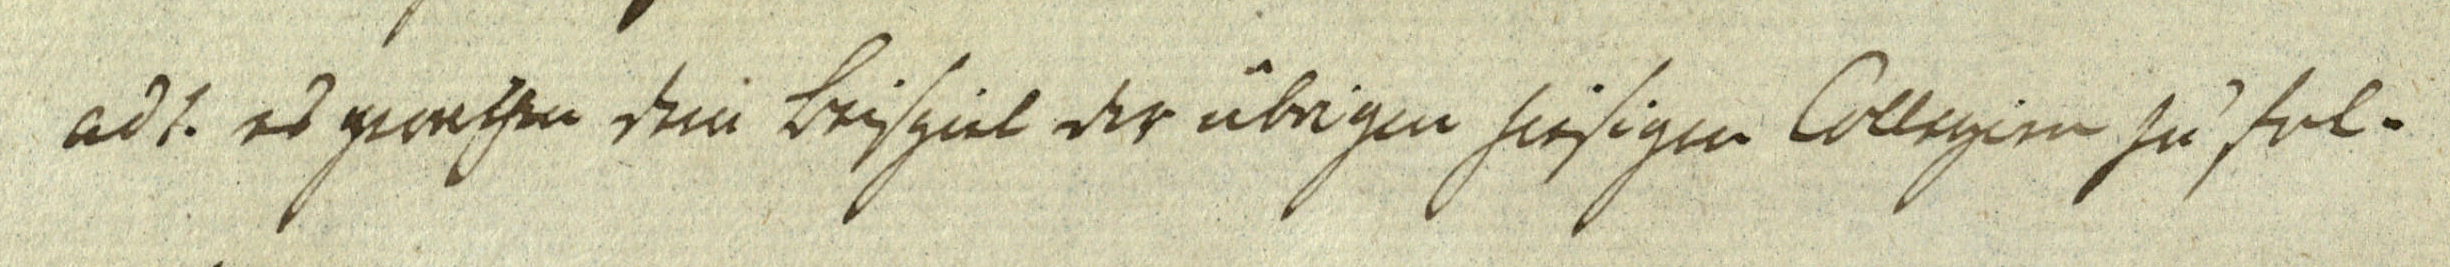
ad 1. es gerathen dem Beispiel der übrigen hiesigen Collegien zu fol¬
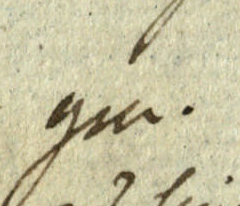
gen.
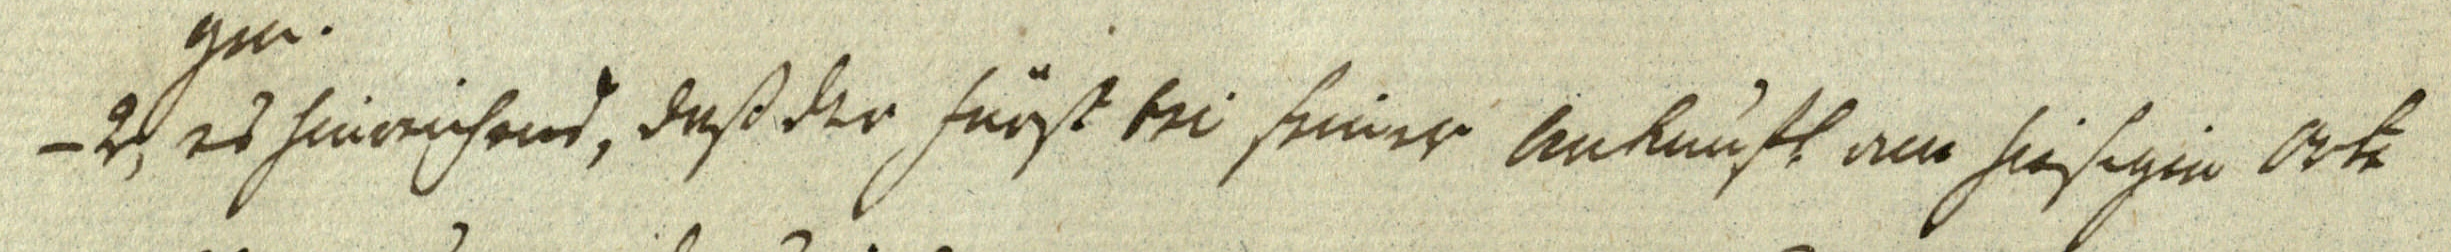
2. es hinreichend, daß der Fürst bei seiner Ankunft am hiesigen Orte
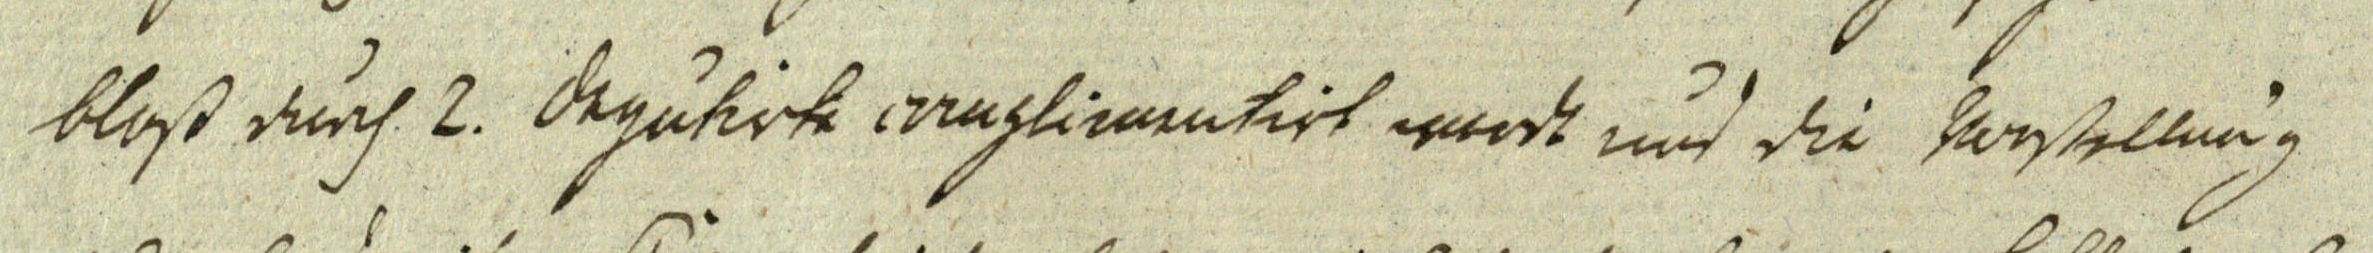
bloß durch 2. Deputirte comlimentirt werde und die Vorstellung
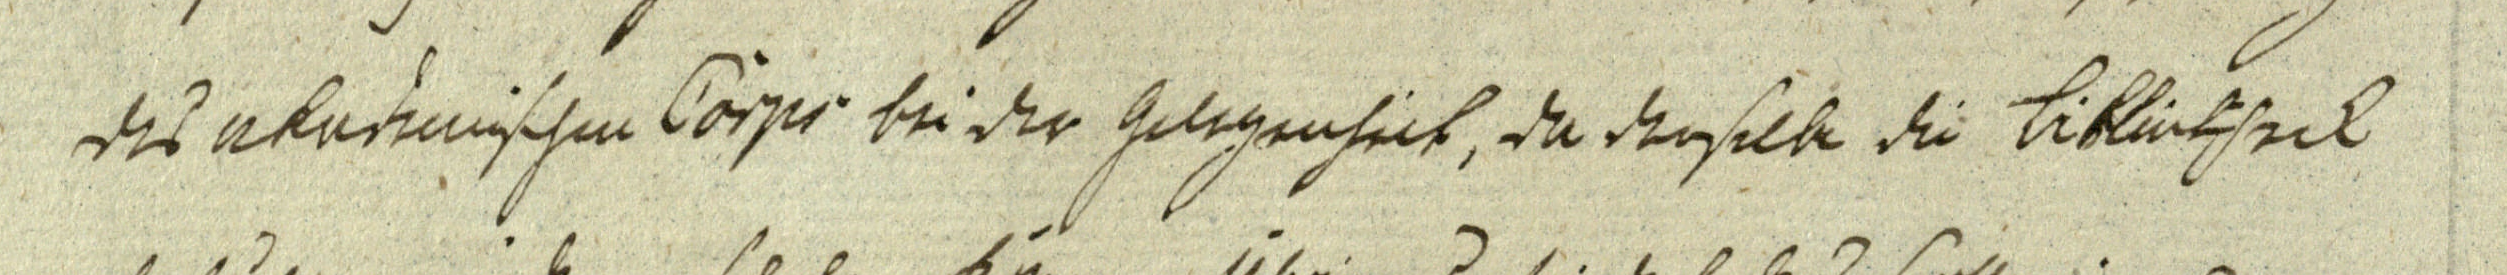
des akademischen Corps bei der Gelegenheit, da derselbe die Bibliotheck
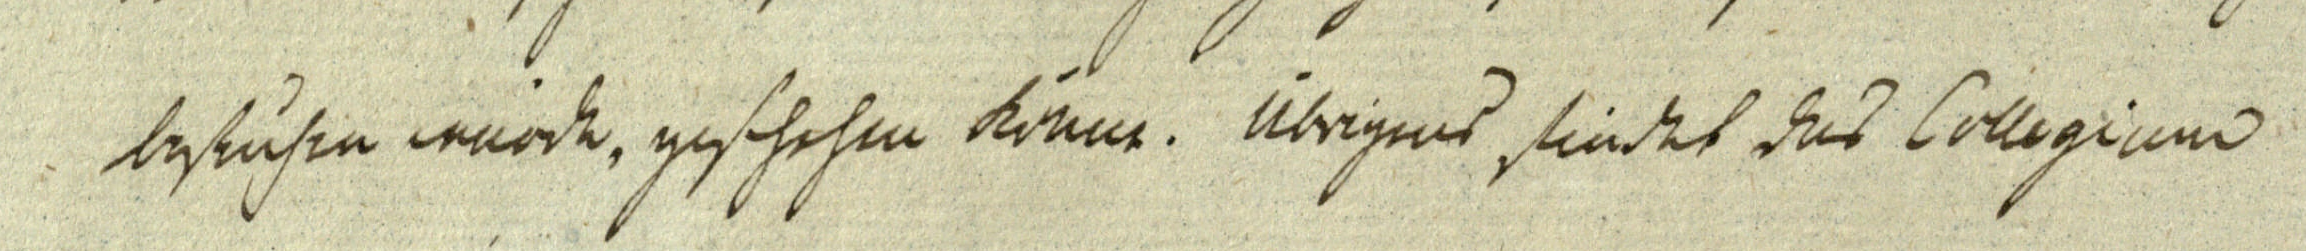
besuchen würde, geschehen könne. Übrigens findet das Collegium
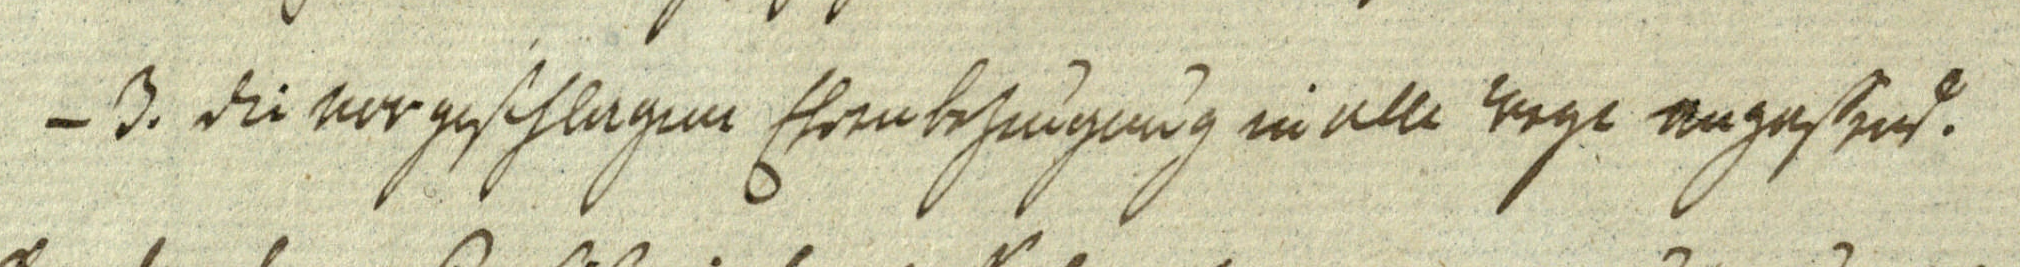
3. die vorgeschlagen Ehrenbezeugung in alle Wege anpassend.
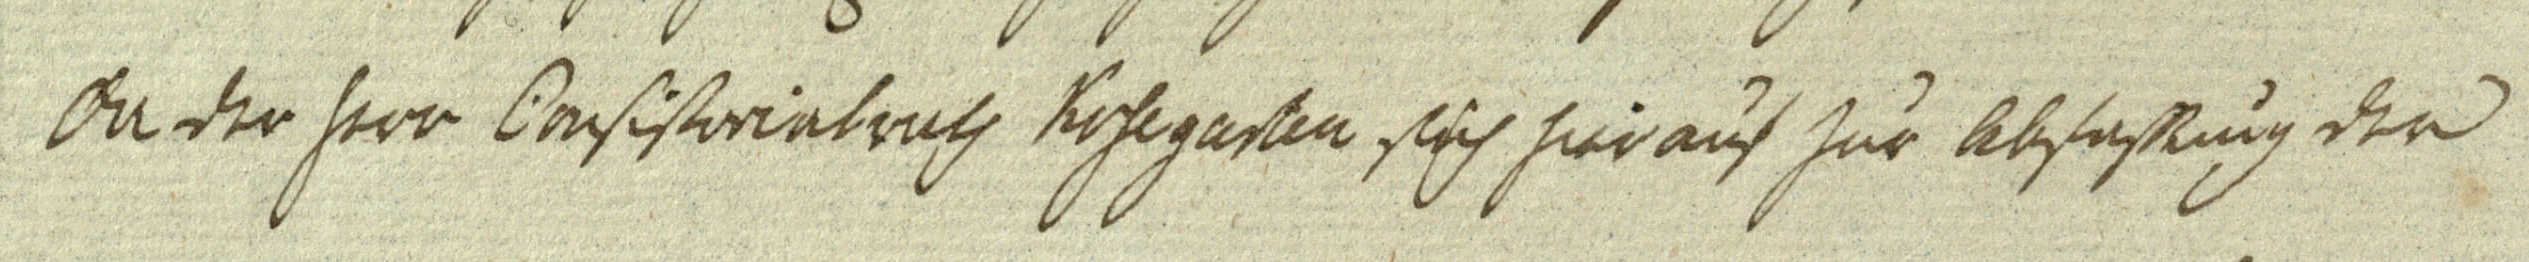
Da der Herr Consistorialrath Kosegarten sich hierauf zur Abfassung der
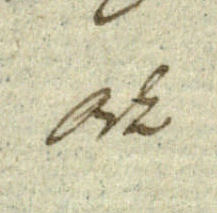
Ode
